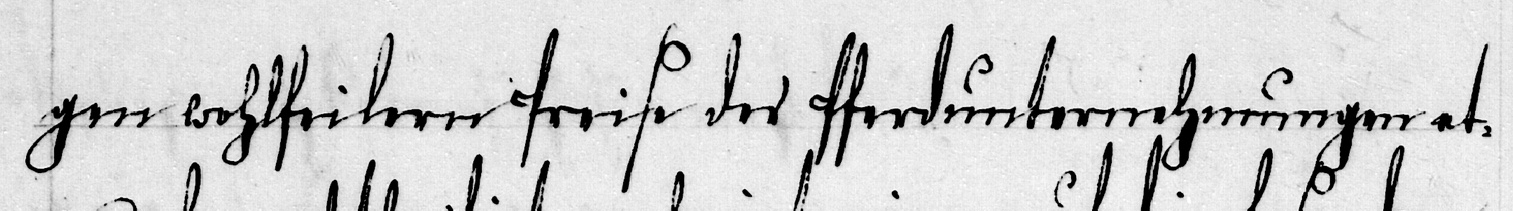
gen wohlfeilern Preise der Pferdunternehmungen et¬
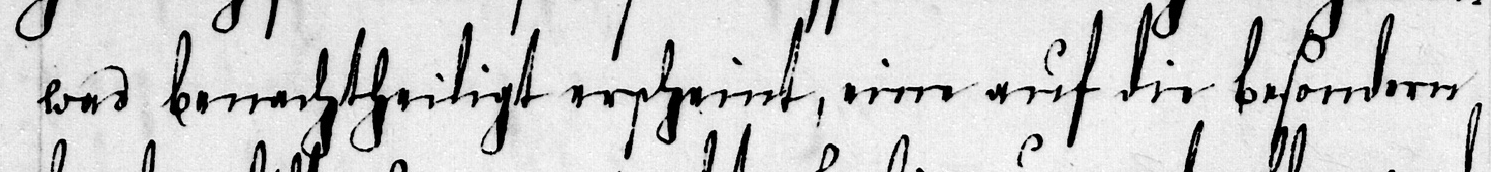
was benachtheiligt erscheint, eine auf die besondern
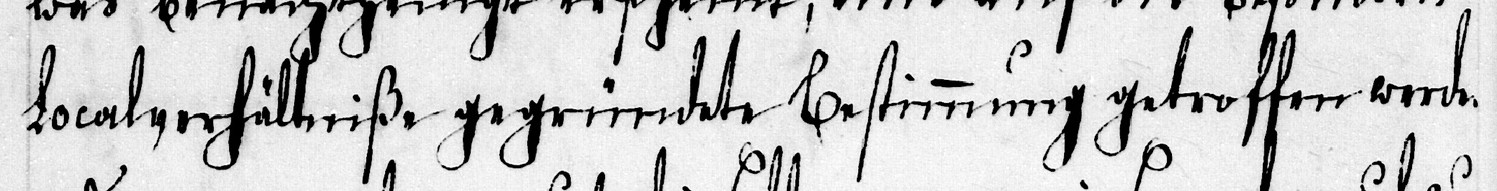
Localverhältniße gegründete Bestimmung getroffen werde.
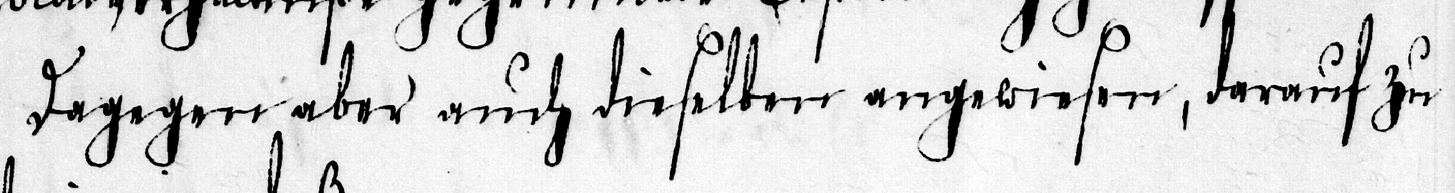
Dagegen aber auch dieselben angewiesen, darauf zu
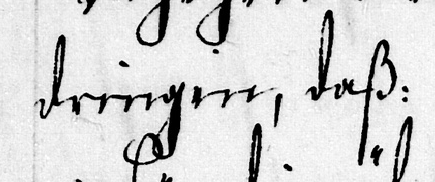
dringen, daß:
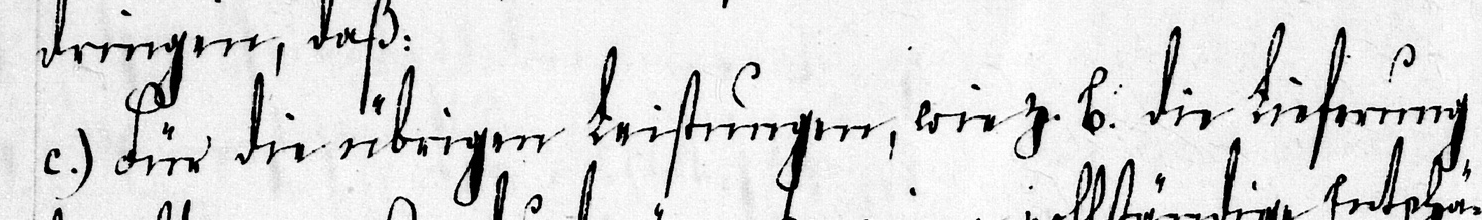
c.) Für die übrigen Leistungen, wie z. B. die Lieferung
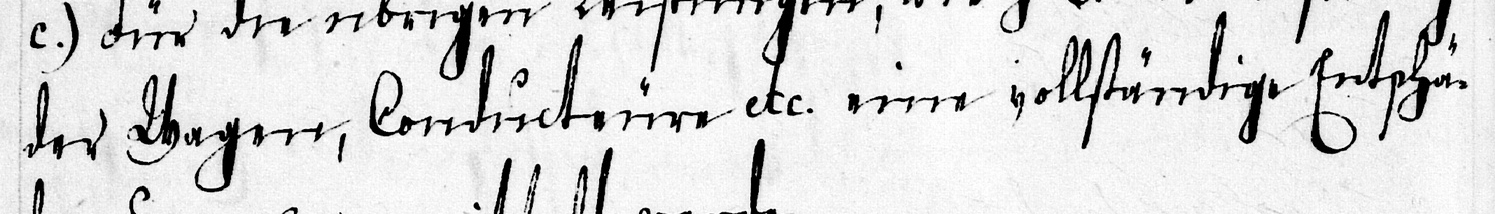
der Wagen, Conducteure etc. eine vollständige Entschä¬
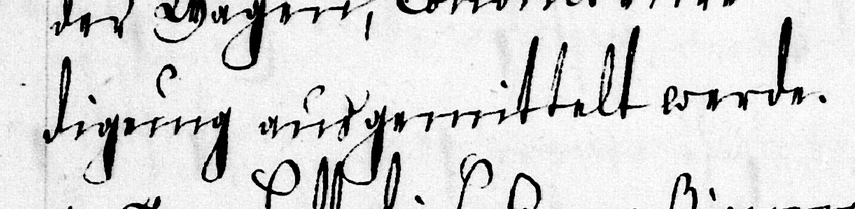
digung ausgemittelt werde.
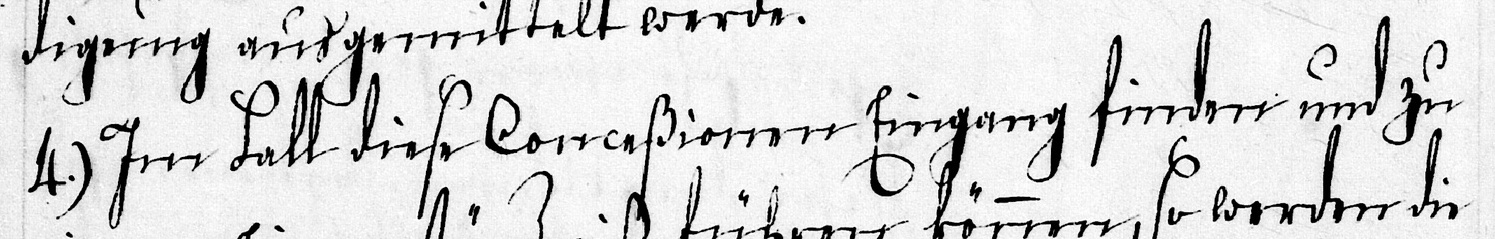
4.) Im Fall diese Conceßionen Eingang finden und zu
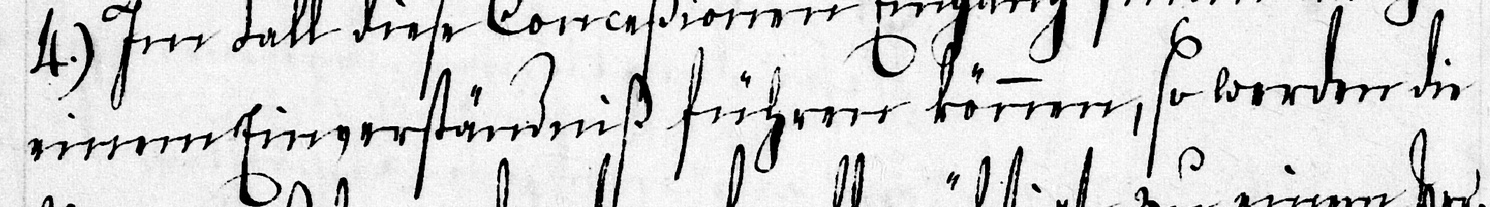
einem Einverständniß führen können, so werden die
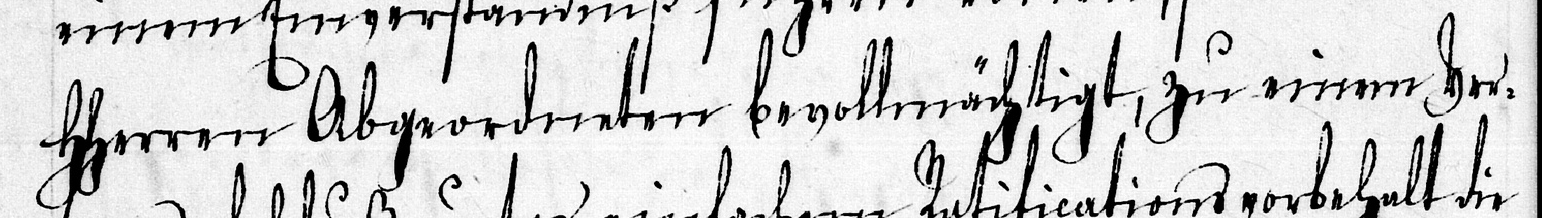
HHerren Abgeordneten bevollmächtigt, zu einem Ver¬
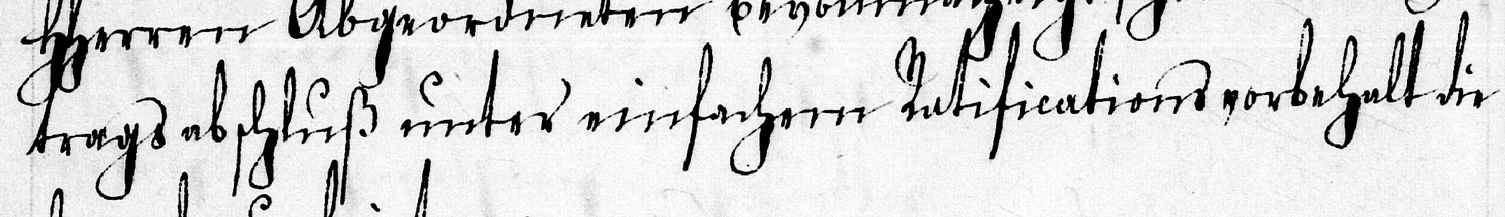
tragsabschluß unter einfachem Ratificationsvorbehalt die
